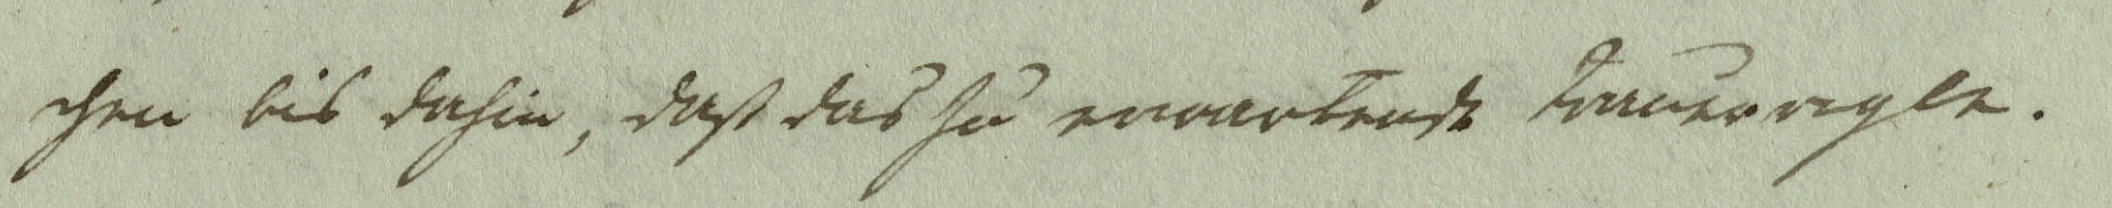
chen bis dahin, daß das zu erwartende Trauerregle¬
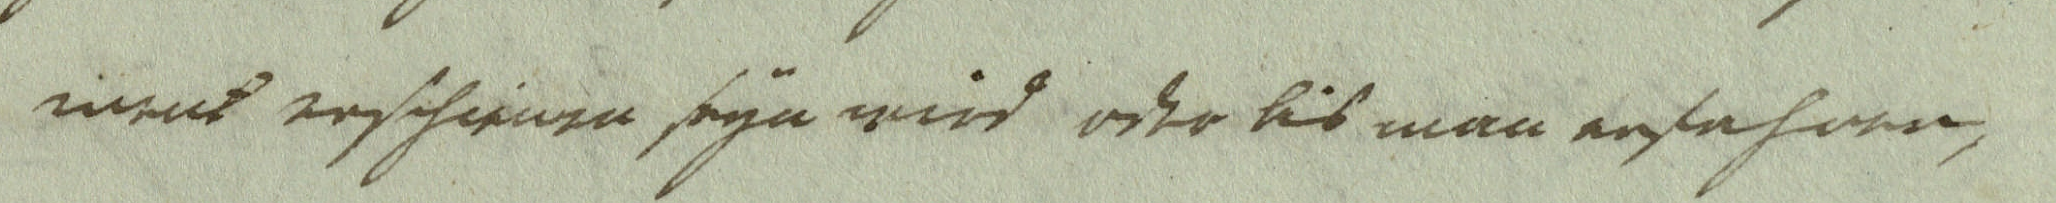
ment erschienen seÿn wird oder bis man erfahren,
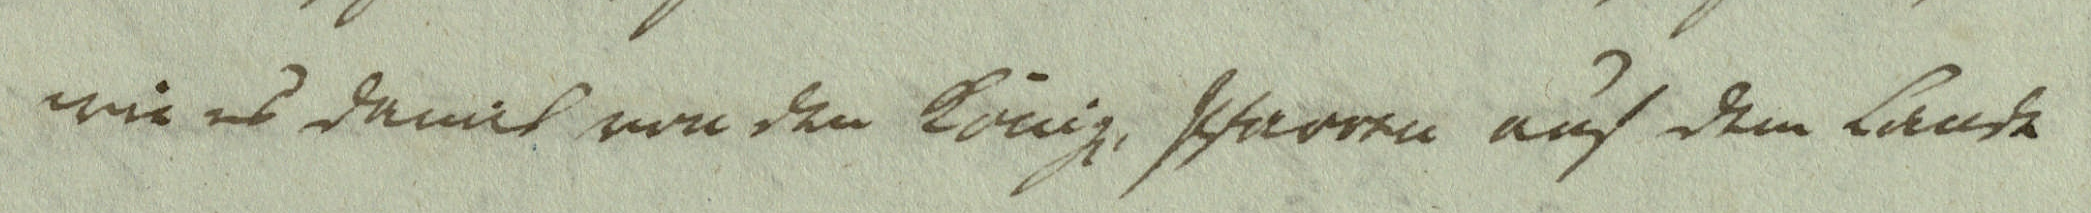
wie es damit von den Königl. Pfarren auf dem Lande
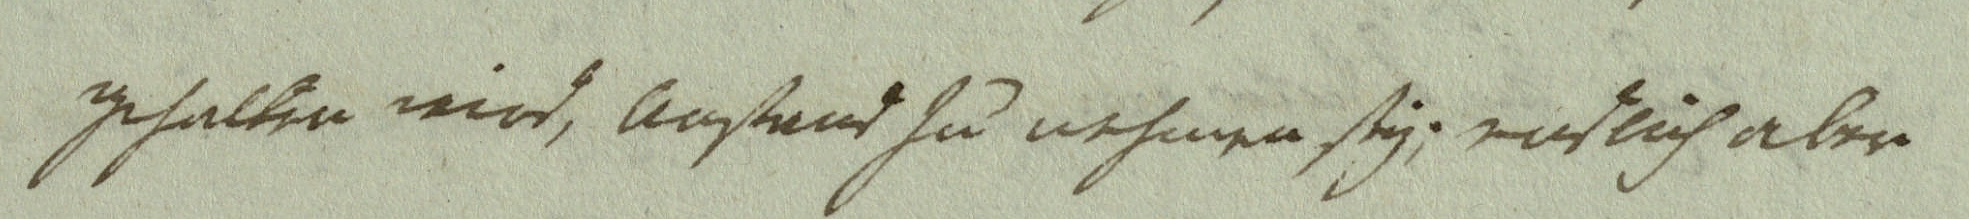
gehalten wird, Anstand zu nehmen seÿ; endlich aber
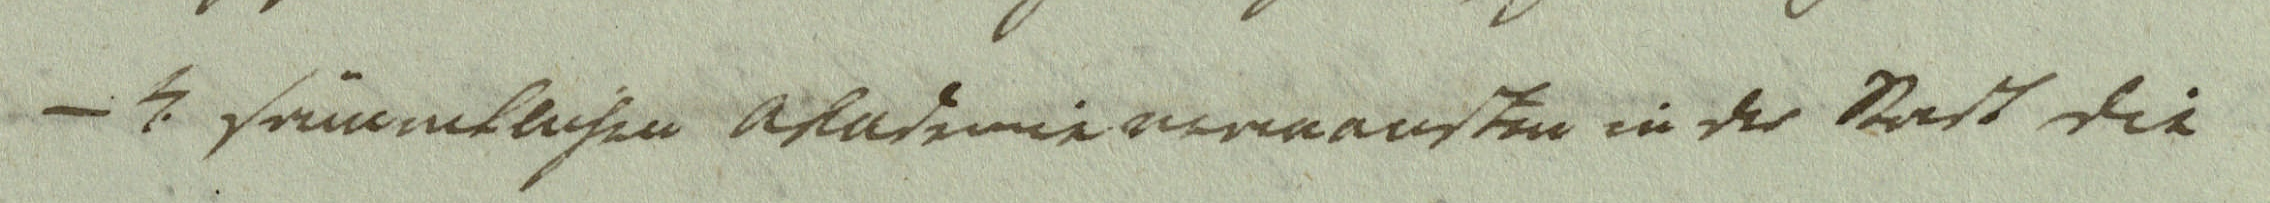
4. sämmtlichen Akademieverwandten in der Stadt die
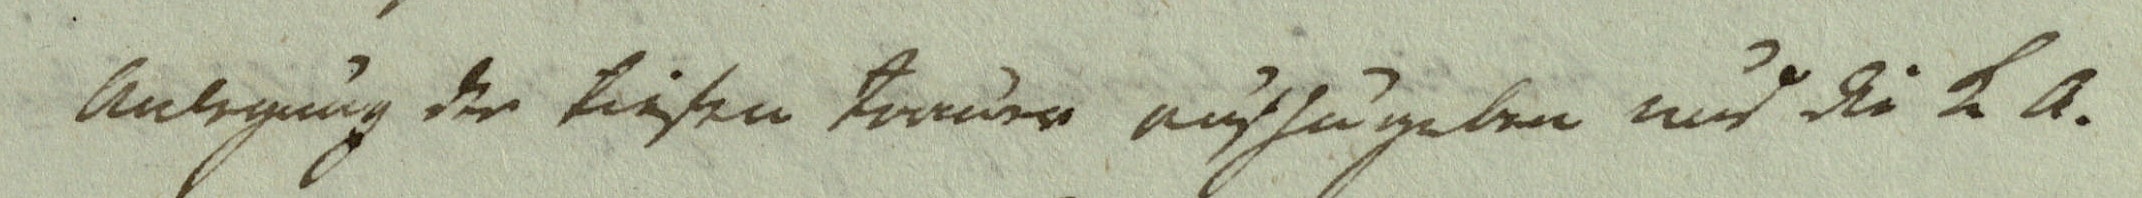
Anlegung der tiefen Trauer aufzugeben und die K. A.
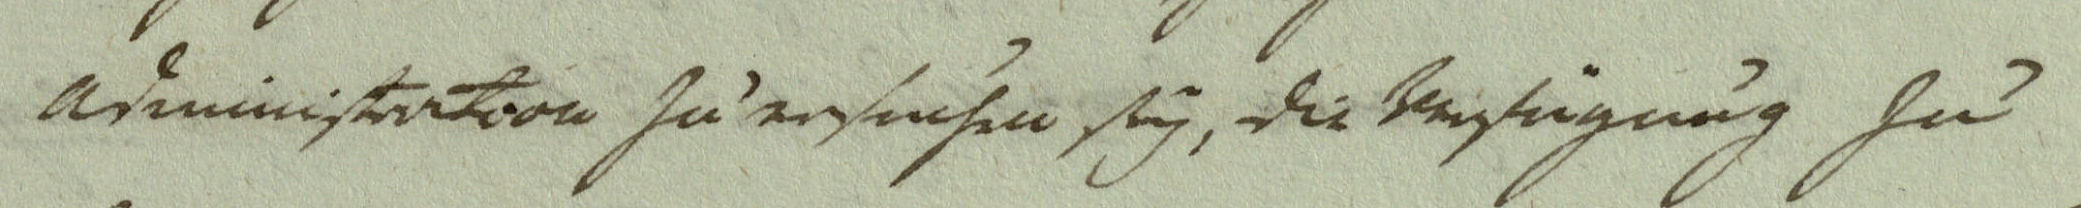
Administration zu ersuchen seÿ, die Verfügung zu
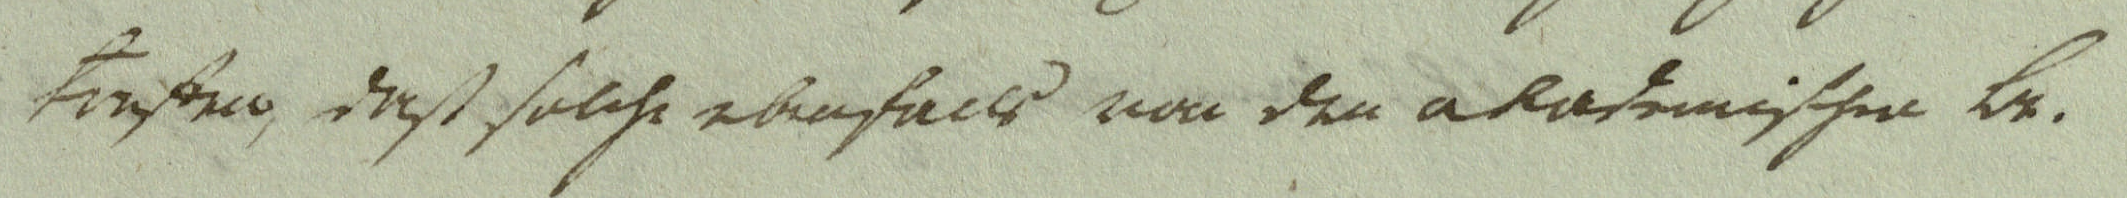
trefen, daß solche ebenfalls von den akademischen Be¬
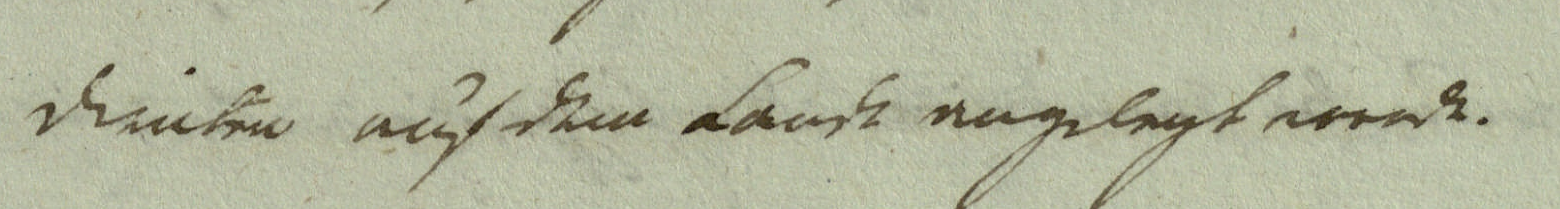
dienten auf dem Lande angelegt werde.
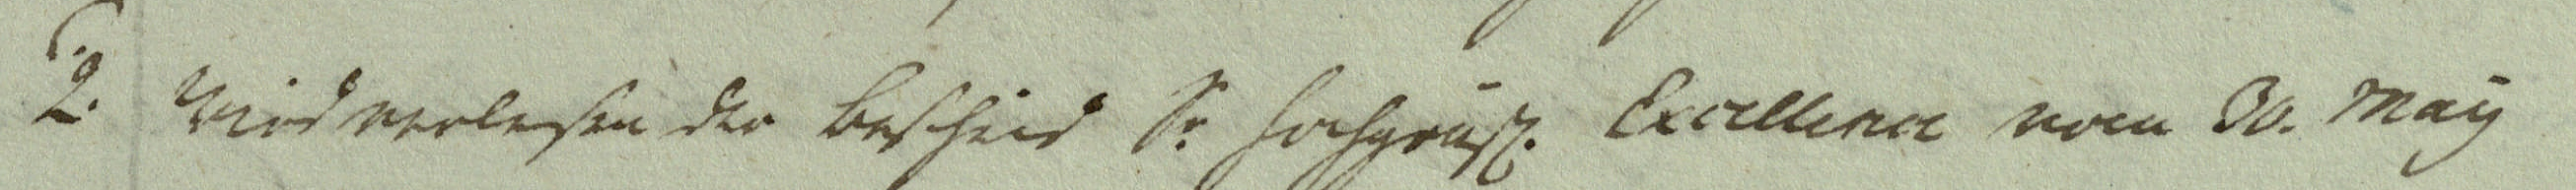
2. Wird verlesen der Bescheid Sr. hochgräfl. Excellence vom 30. Maÿ
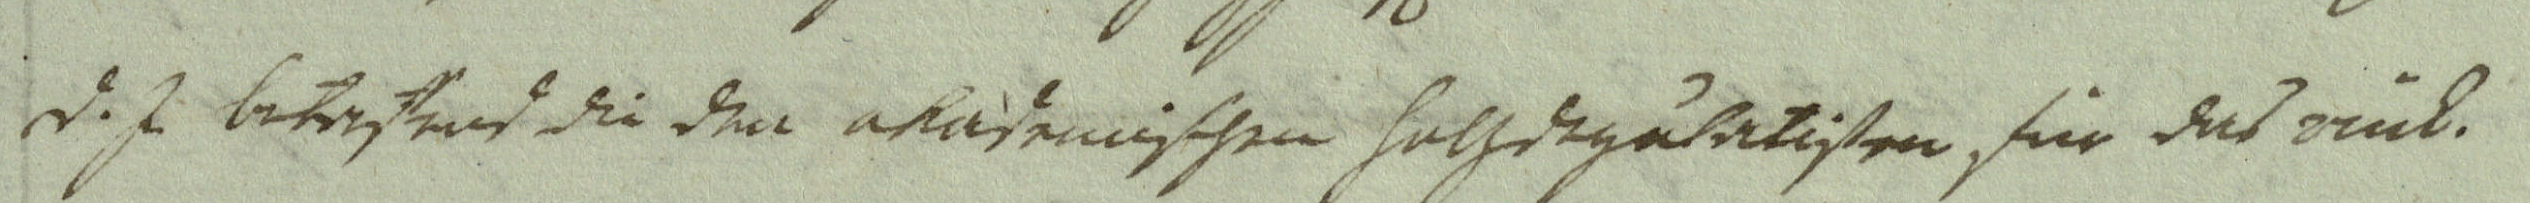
d. J. betreffend den akademischen holzdeputatisten für das rück¬
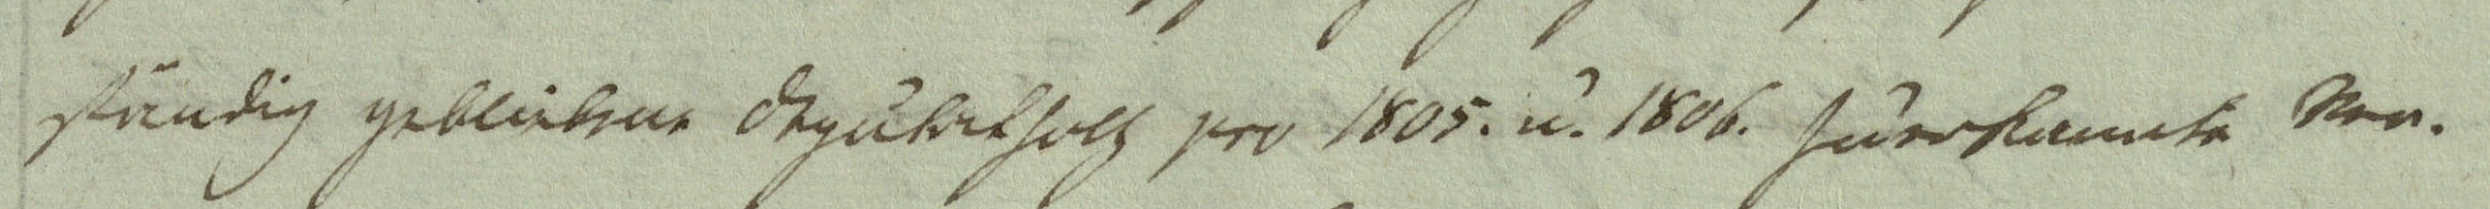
ständig gebliebene Deputatholz pro 1805. u. 1806. zuerkannte Ver¬
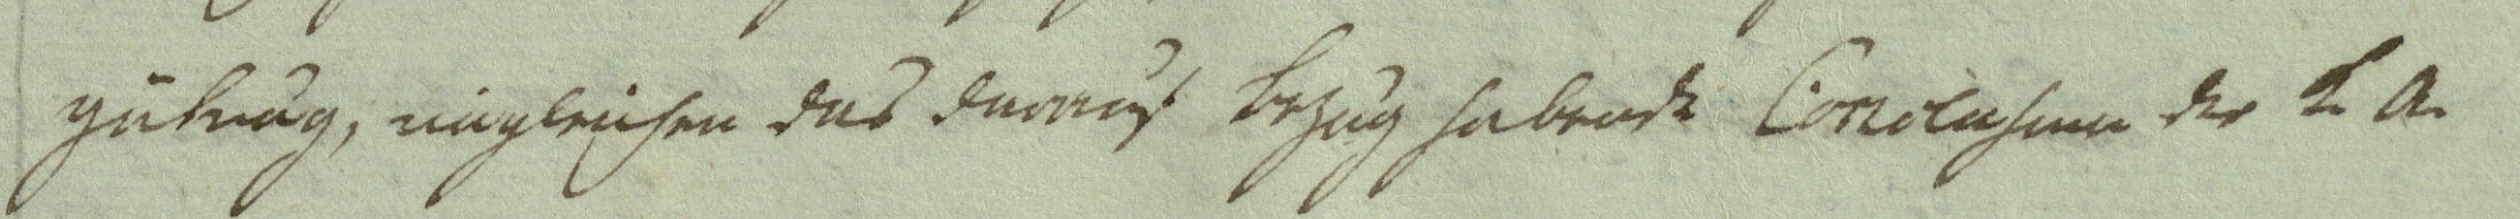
gütung, imgleichen das darauf Bezug habende Conclusum der K. A.
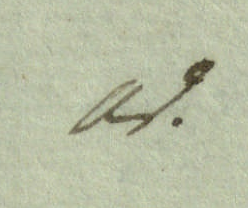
Ad.
